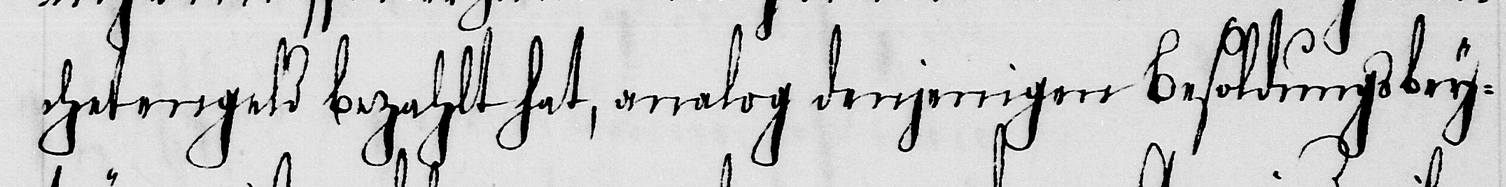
chetengeld bezahlt hat, analog denjenigen Besoldungsbey¬
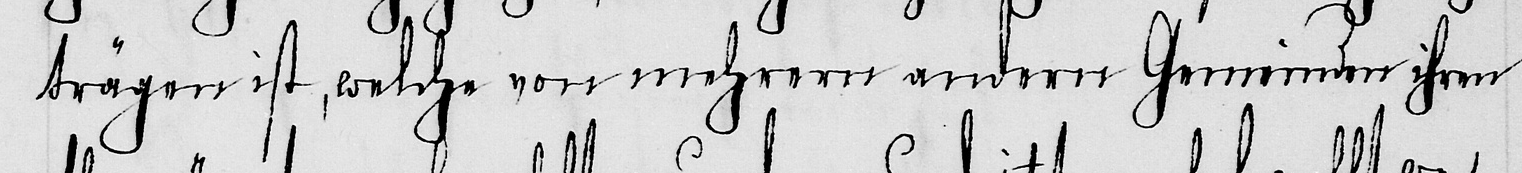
trägen ist, welche von mehrern andern Gemeinden ihren
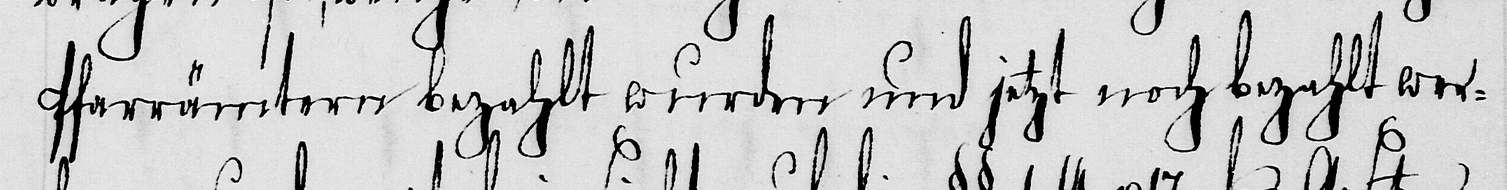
Pfarrämtern bezahlt wurden und jetzt noch bezahlt wer¬
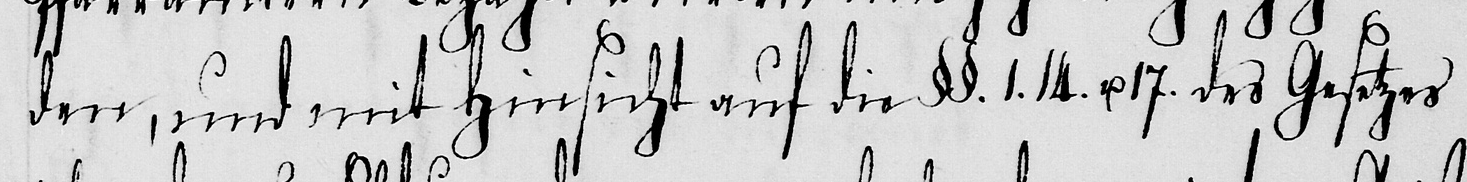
den, und mit Hinsicht auf die §§. 1. 14. & 17. des Gesetzes
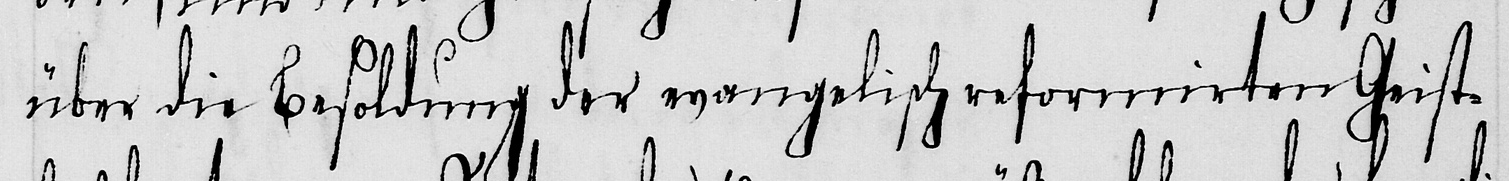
über die Besoldung der evangelisch reformirten Geist¬
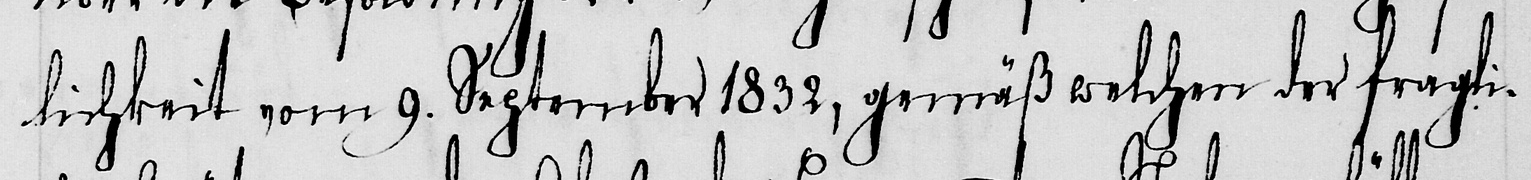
lichkeit vom 9. September 1832, gemäß welchen der fragli¬
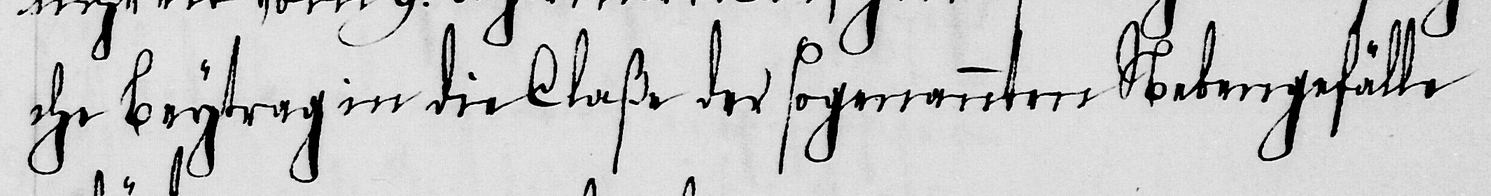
che Beytrag in die Claße der sogenannten Nebengefälle
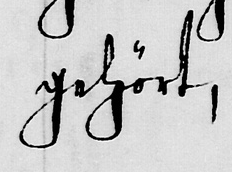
gehört,
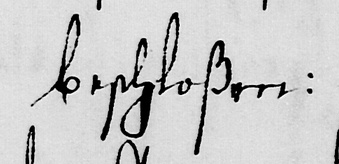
beschloßen:
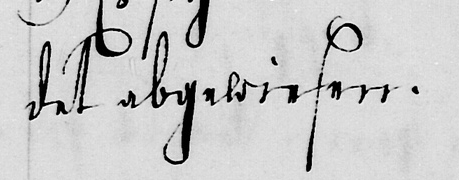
det abgewiesen.
